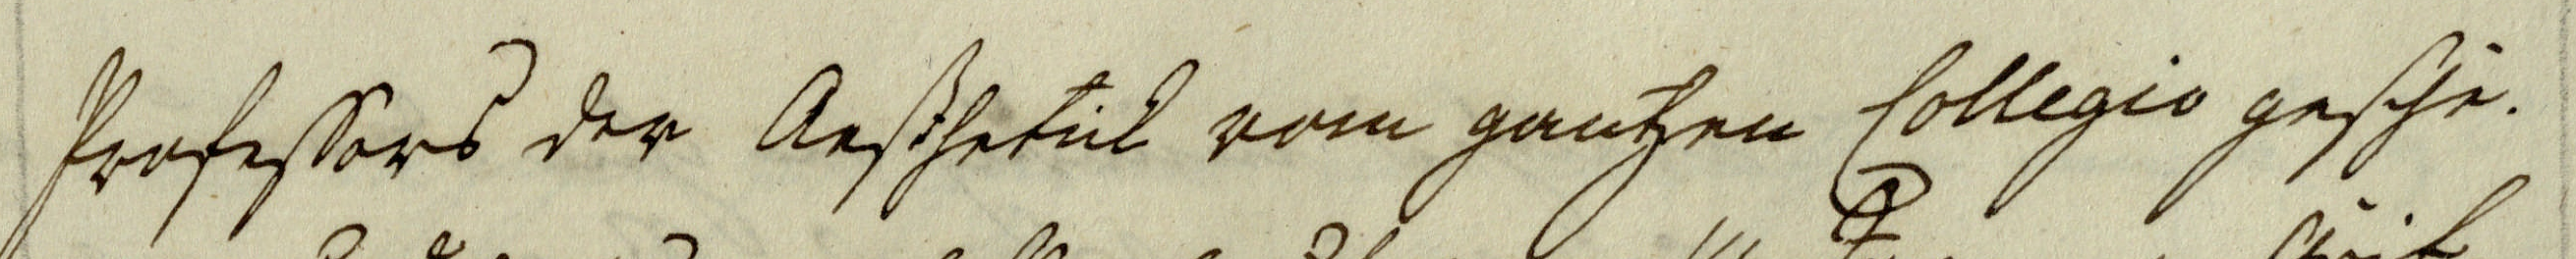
Professors der Aesthetick vom gantzen Collegio gesche¬
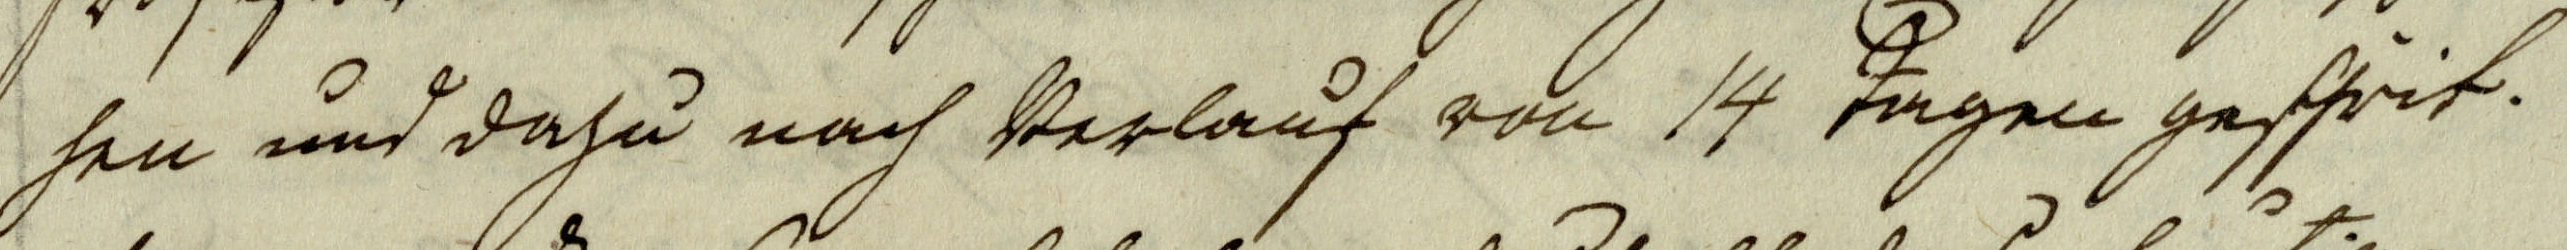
hen und dazu nach Verlauf von 14 Tagen geschrit¬
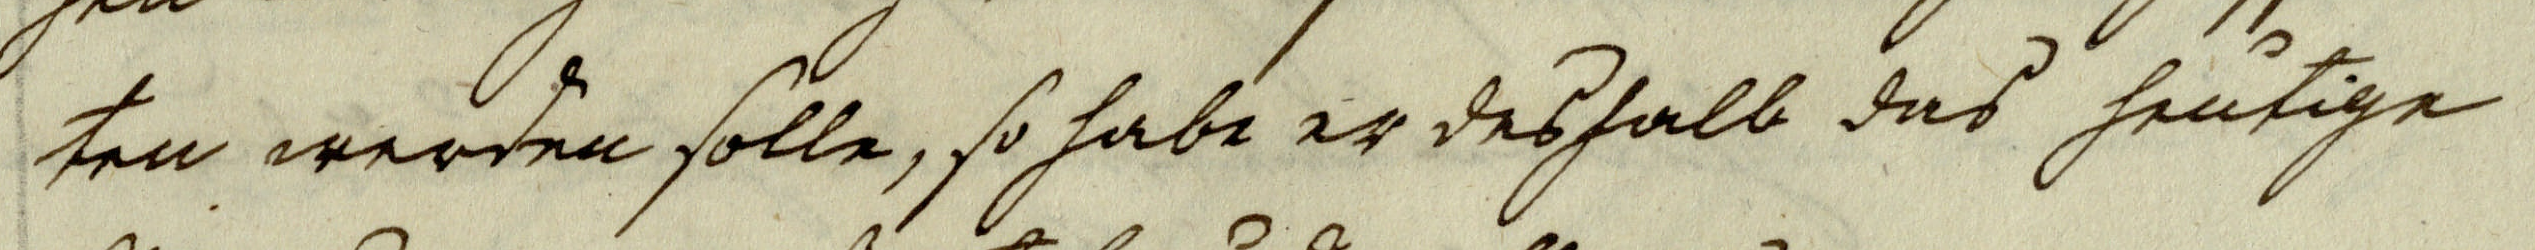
ten werden solle, so habe er deshalb das heutige
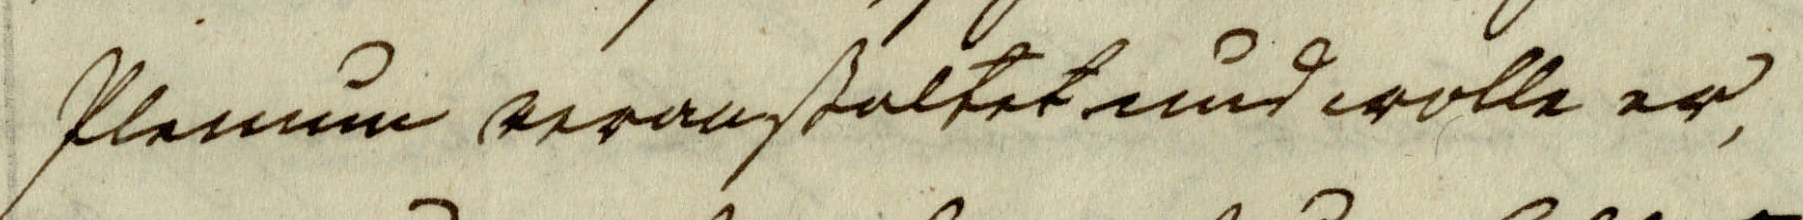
Plenum veranstaltet und wolle er,
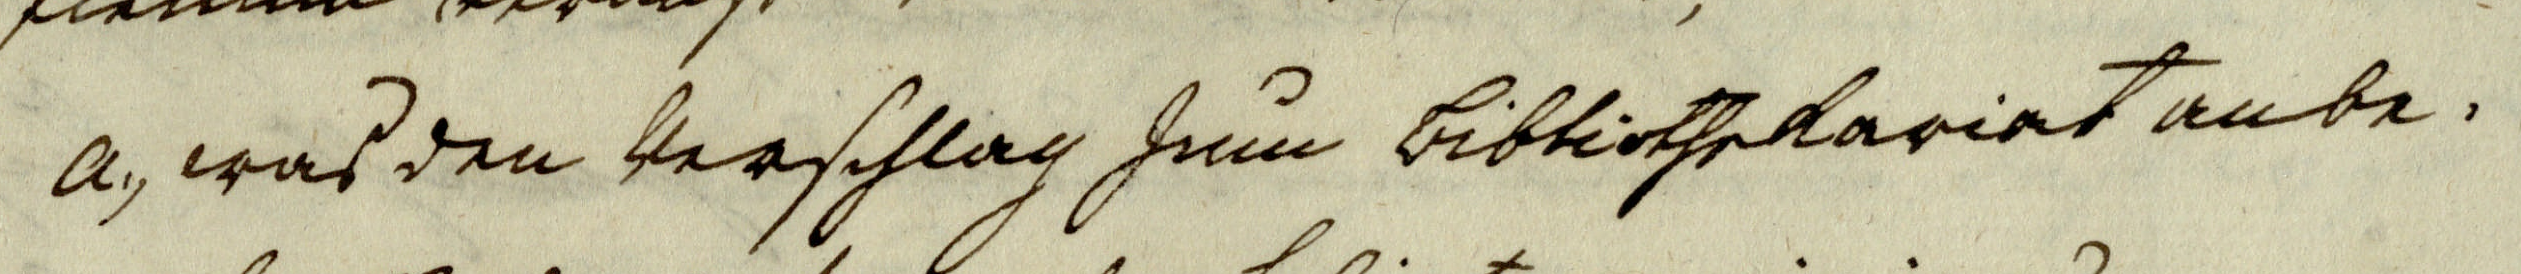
a., was den Vorschlag zum Bibliothekariat anbe¬
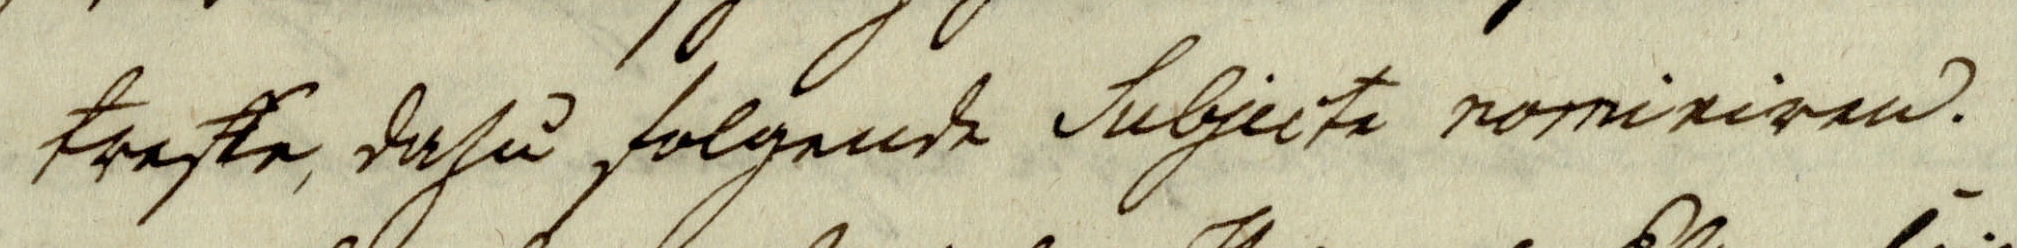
treffe, dazu folgende Subjecte nominiren.
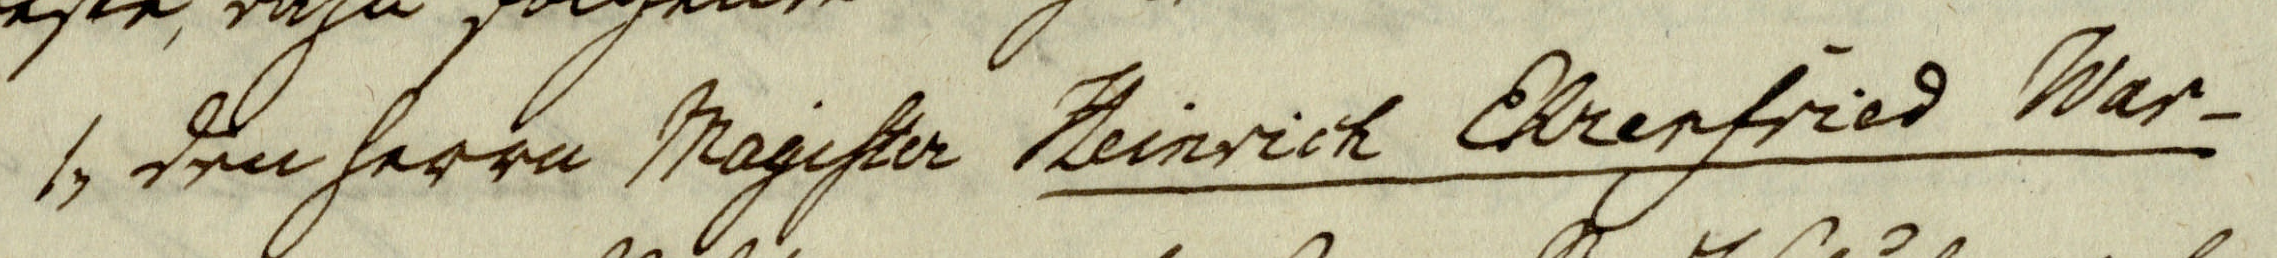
1., den Herrn Magister Heinrich Ehrenfried War¬
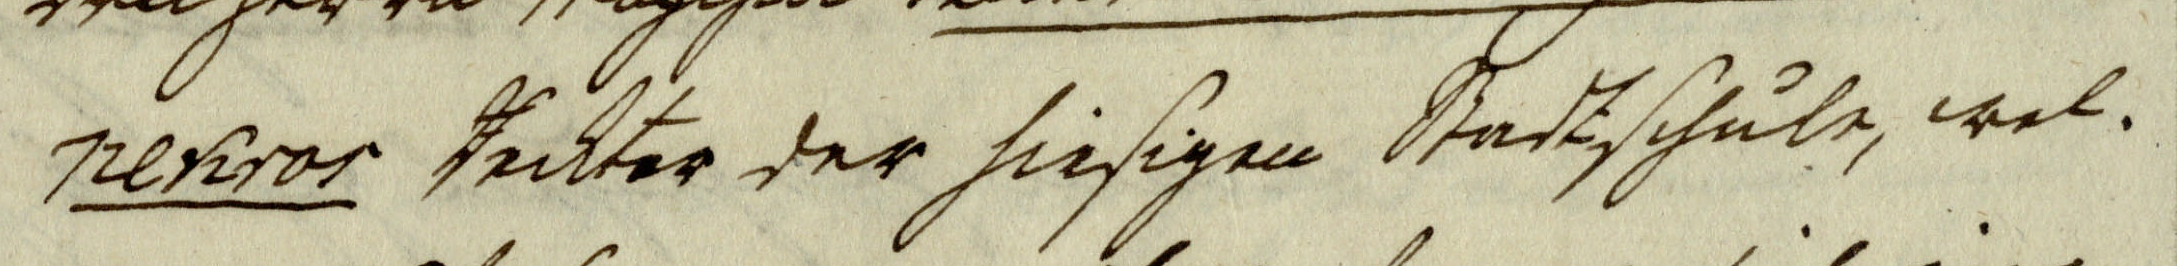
nekros Recktor der hiesigen Stadtschule, wel¬
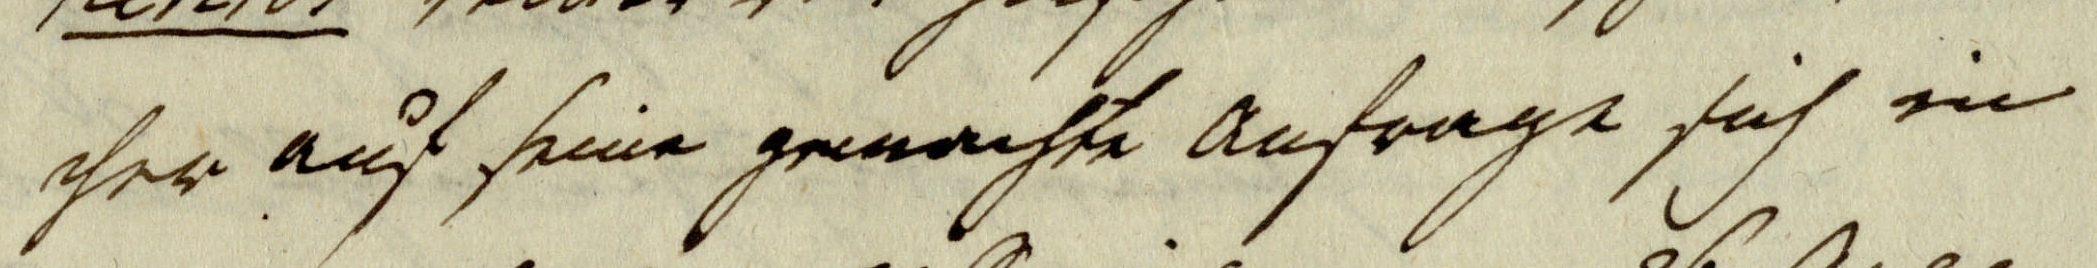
cher auf seine gemachte Anfrage sich in
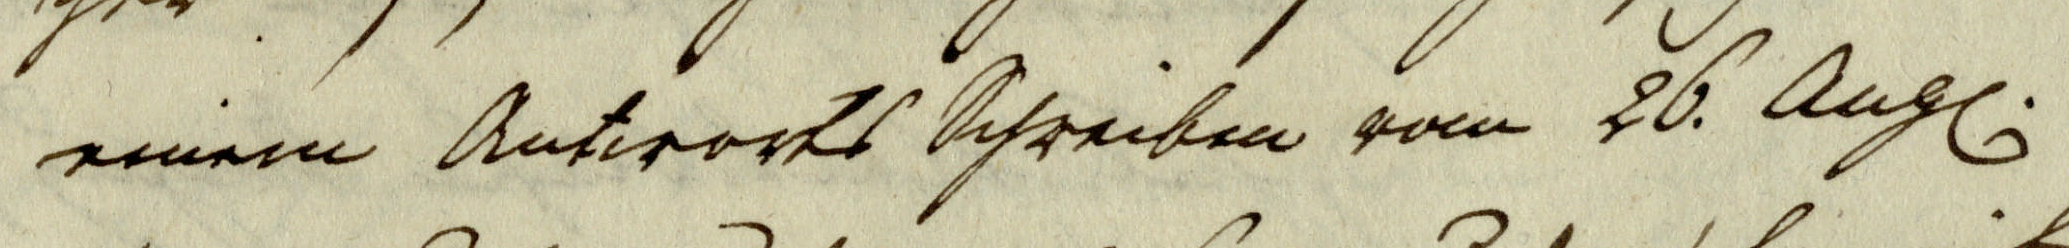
einem Antworts Schreiben vom 26. Aug.
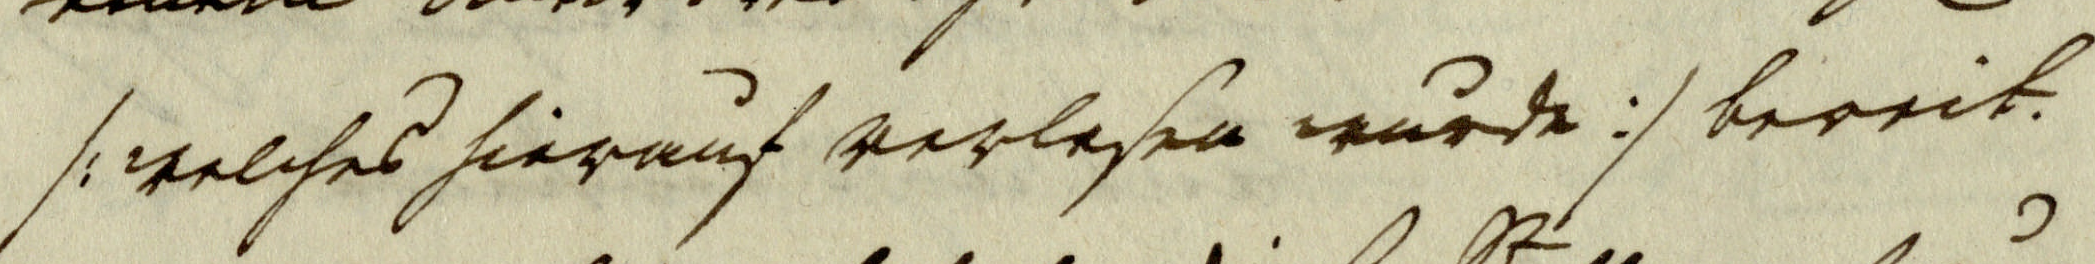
/: welches hierauf verlesen wurde :/ bereit¬
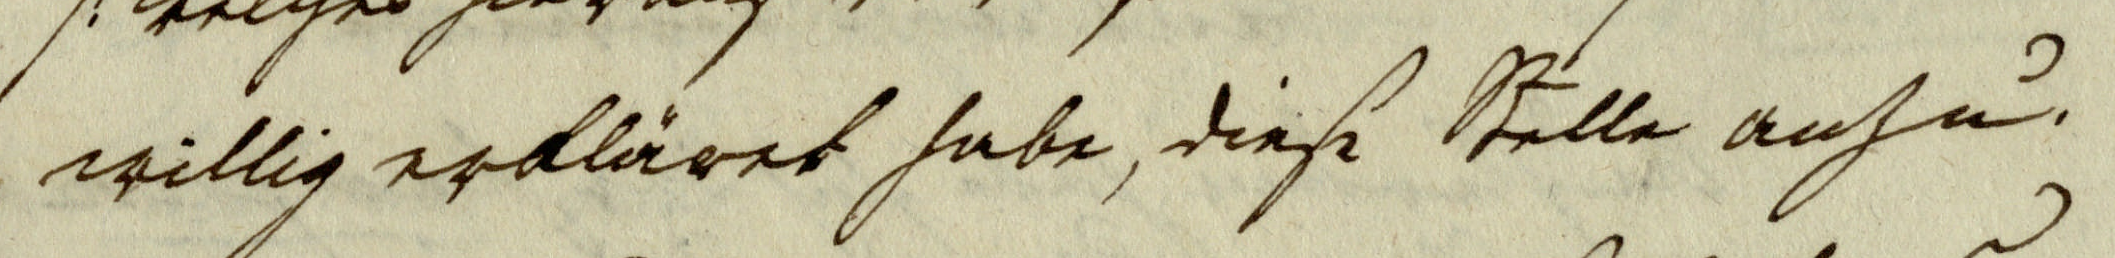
willig erkläret habe, diese Stelle anzu¬
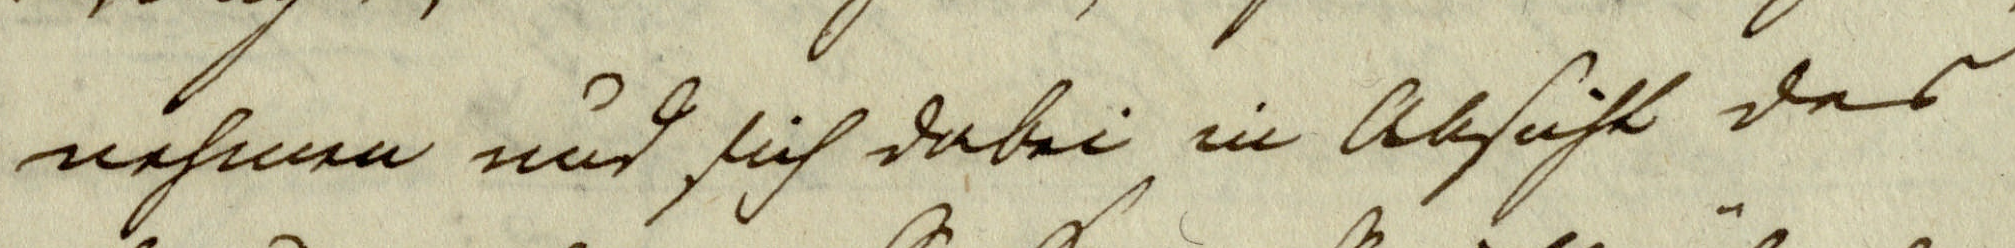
nehmen und sich dabei in Absicht des
